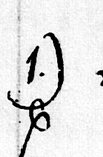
2.
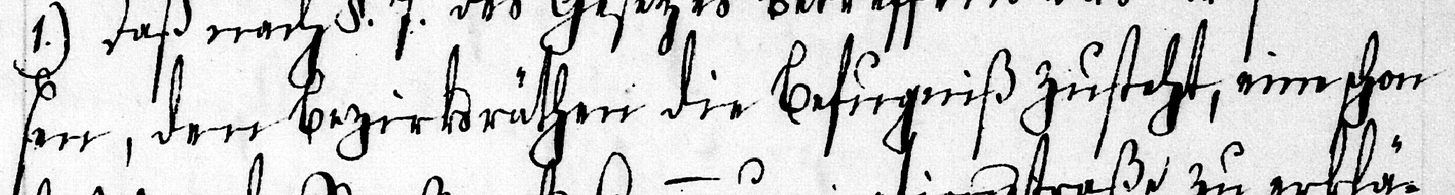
sen, den Bezirksräthen die Befugniß zusteht, eine schon
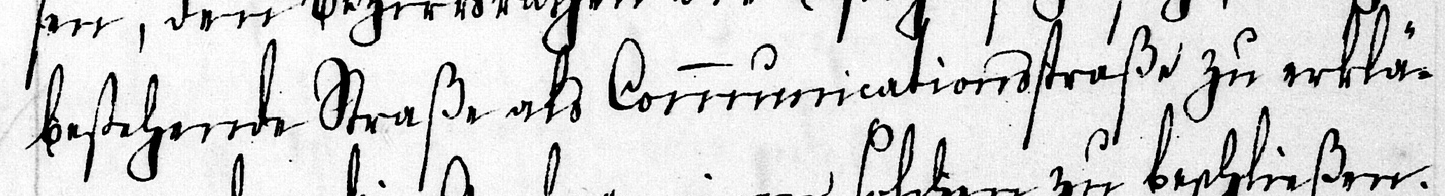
bestehende Straße als Communicationsstraße zu erklä¬
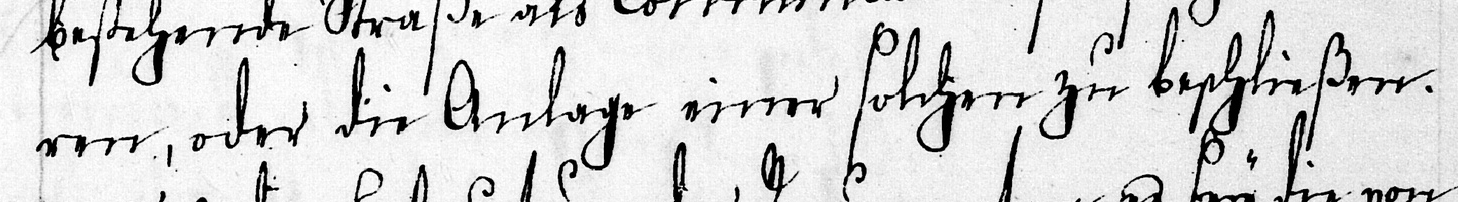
ren, oder die Anlage einer solchen zu beschließen.
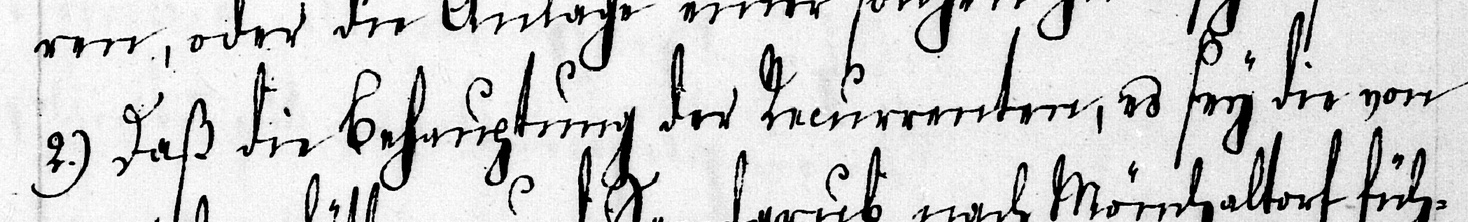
2.) Daß die Behauptung der Recurrenten, es sey die von
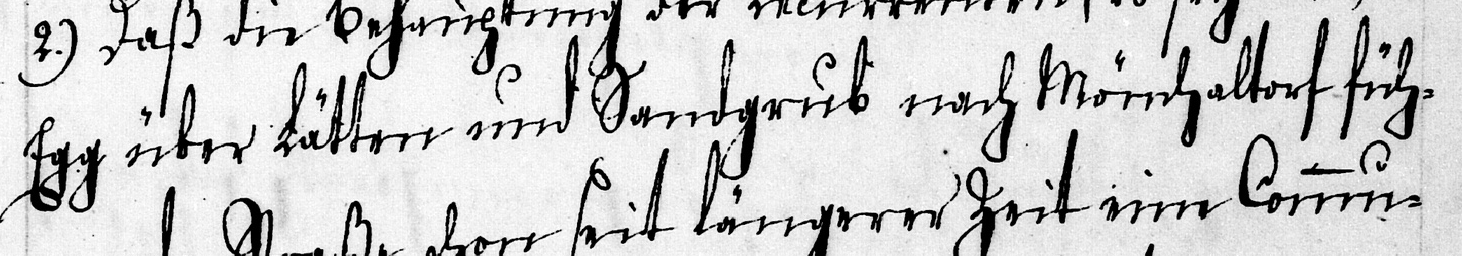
Egg über Lätten und Sandgrub nach Mönchaltorf füh¬
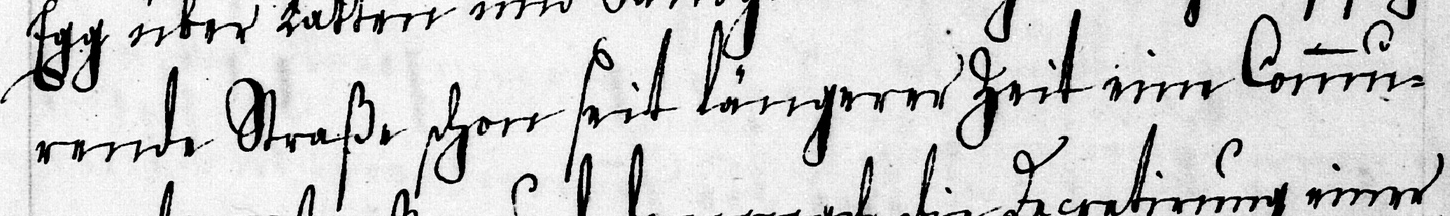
rende Straße schon seit längerer Zeit eine Commu¬
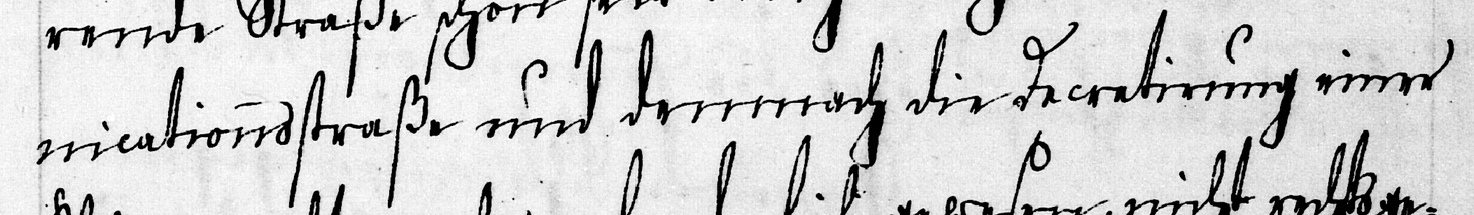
nicationsstraße und demnach die Decretirung einer
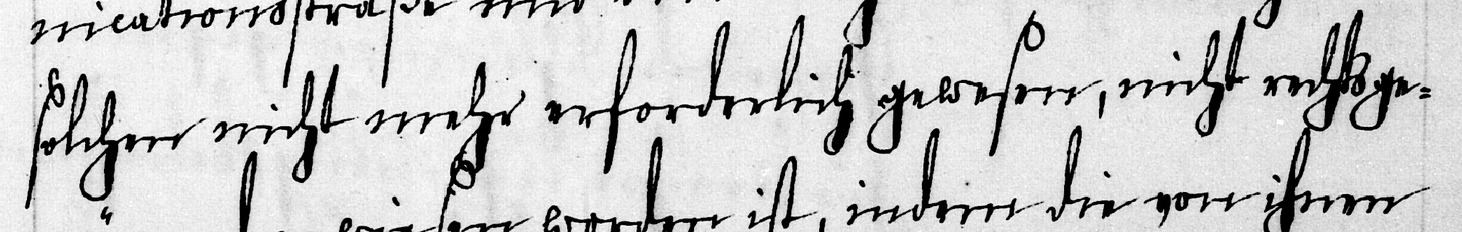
solchen nicht mehr erforderlich gewesen, nicht rechtsge¬
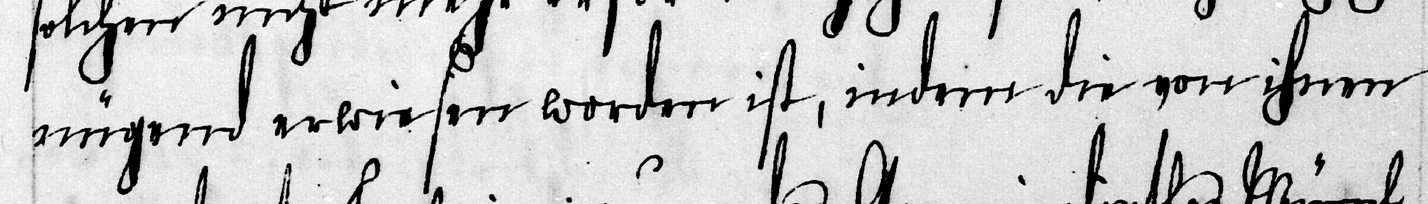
nügend erwiesen worden ist, indem die von ihnen
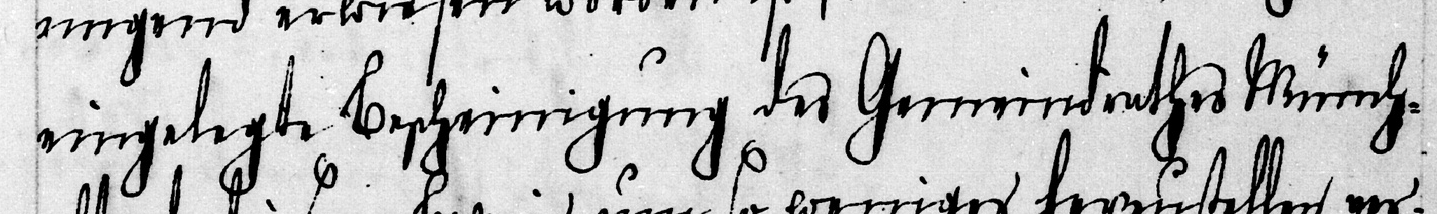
eingelegte Bescheinigung des Gemeindrathes Münch¬
